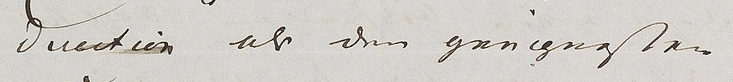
Direction als den geeignesten
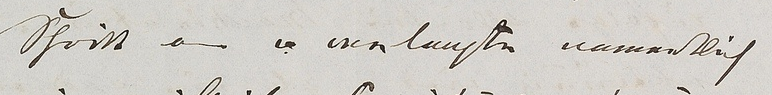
Schritt an & verlangte namentlich
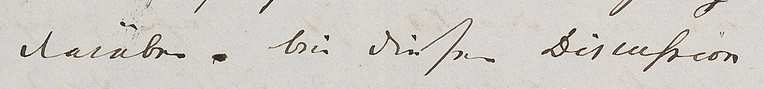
darüber. Bei dieser Discussion
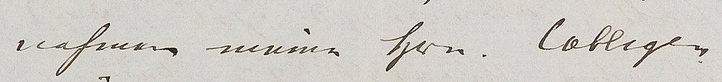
nahmen meine Hrn. Collegen
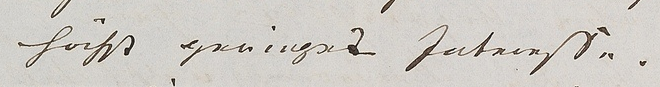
höchst geringes Interesse.
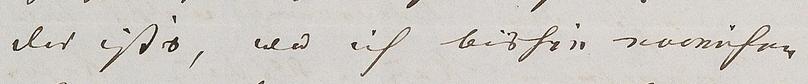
Das ist's, was ich bishin erreichen
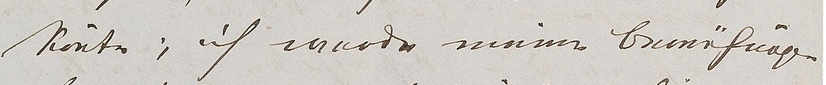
konnte; ich werde meine Bemühungen
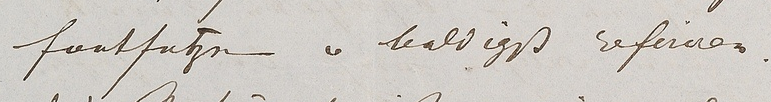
fortsetzen & baldigst referiren.
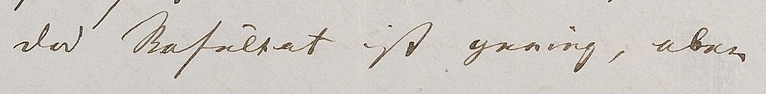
Das Resultat ist gering, aber
